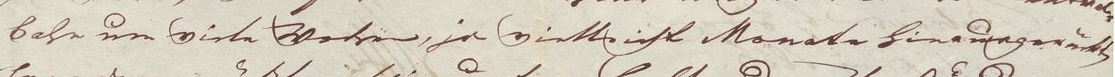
bahn um viele Wochen, ja vielleicht Monate hinausgerückt
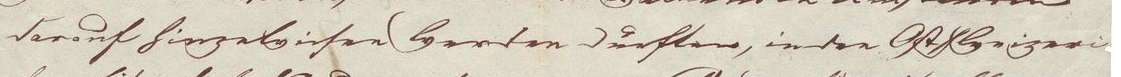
darauf hingewiesen werden dürften, in den Ostschweizeri-
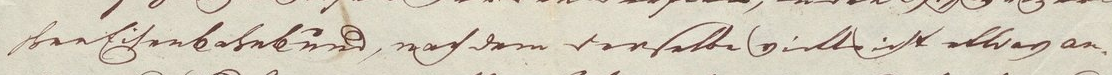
schen Eisenbahnbund, nach dem derselbe vielleicht etwas an-
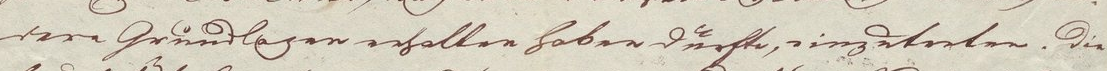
dere Grundlagen erhalten haben dürfte, einzutreten. Die
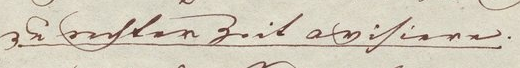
zu rechter Zeit avisiere.
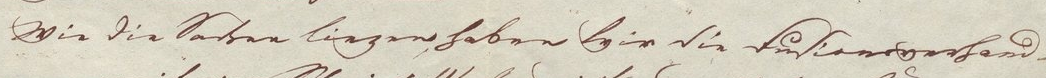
Wie die Sachen liegen, haben wir die Fusionsverhand-
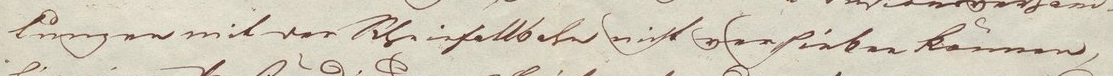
lungen mit der Rheinfallbahn nicht verschieben können,
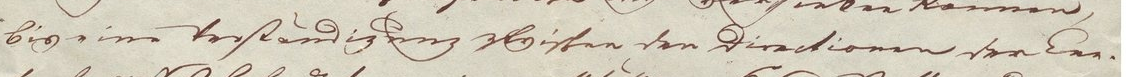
bis eine Verständigung zwischen den Directionen der Cen-
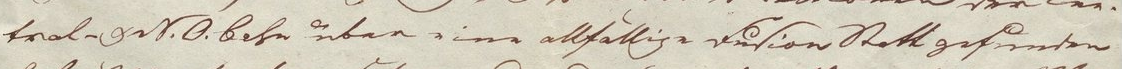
tral- & N.O.bahn über eine allfällige Fusion Statt gefunden
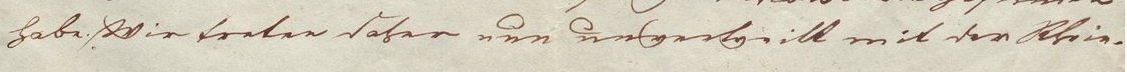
habe. Wir treten daher nun unverweilt mit der Rhein-
